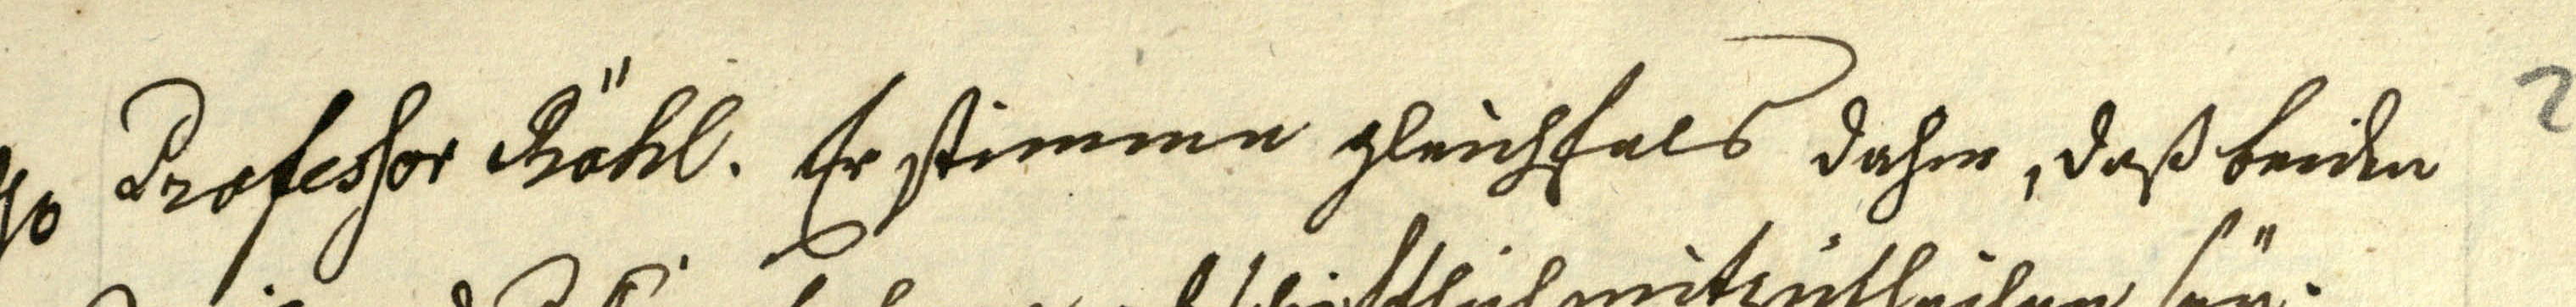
dh Professor Röhl. Er stimme gleichfals dahin, daß beiden
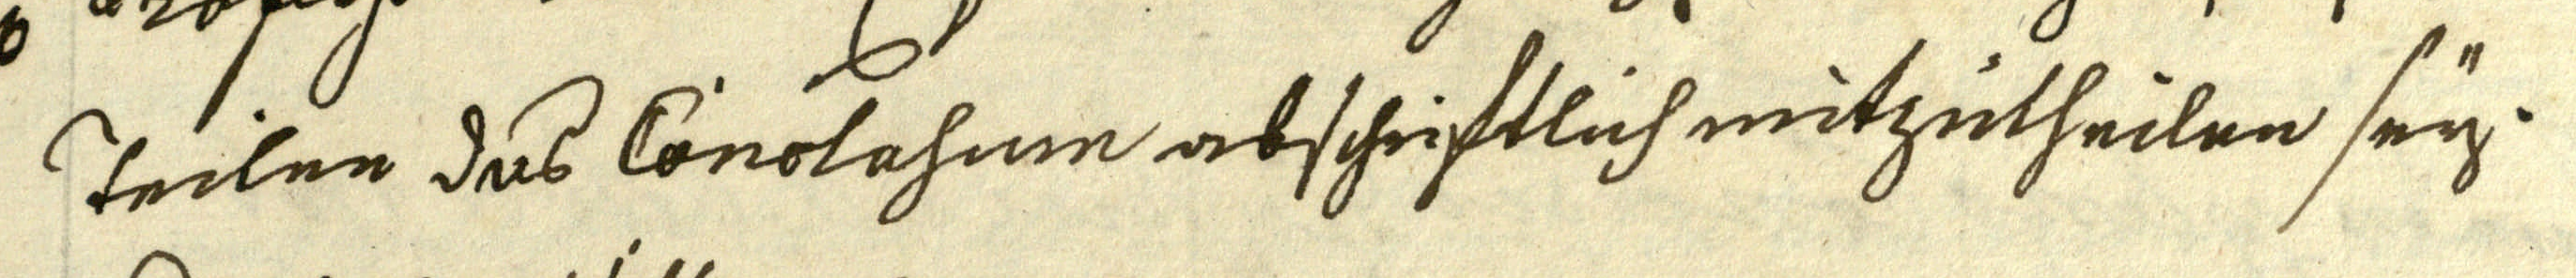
Teilen das Conclusum abschriftlich mitzutheilen seÿ.
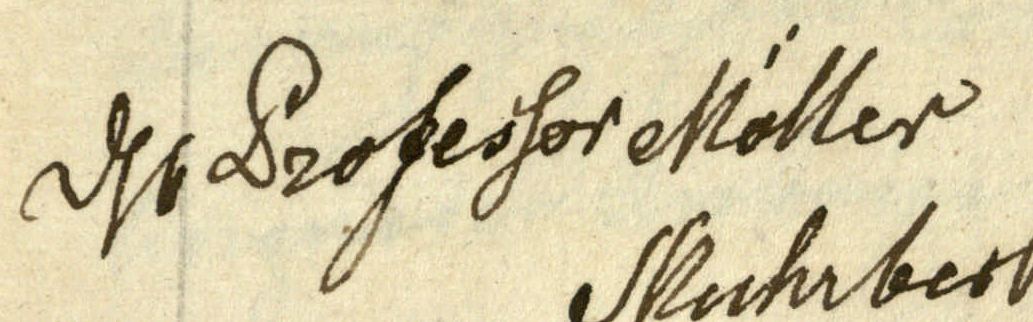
dh Professor Möller
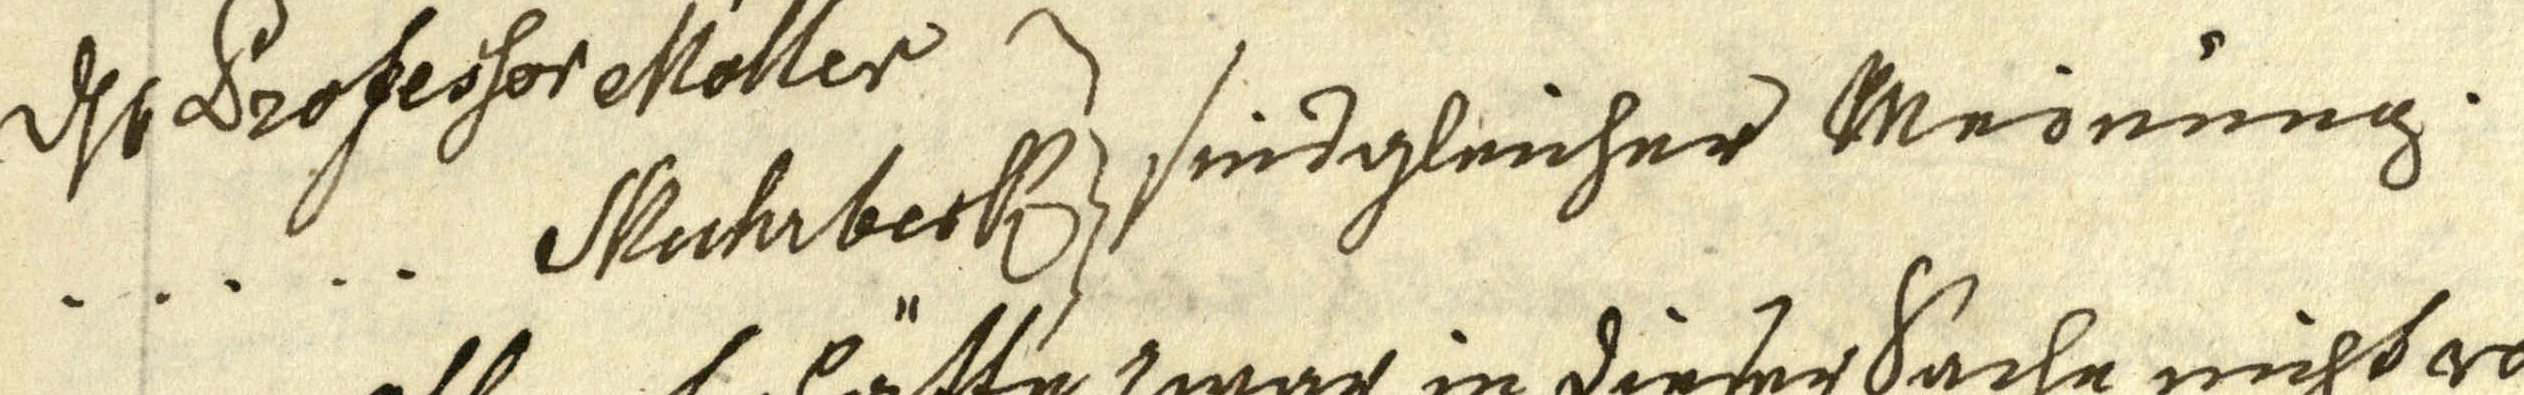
Muhrbeck sind gleicher Meinung.
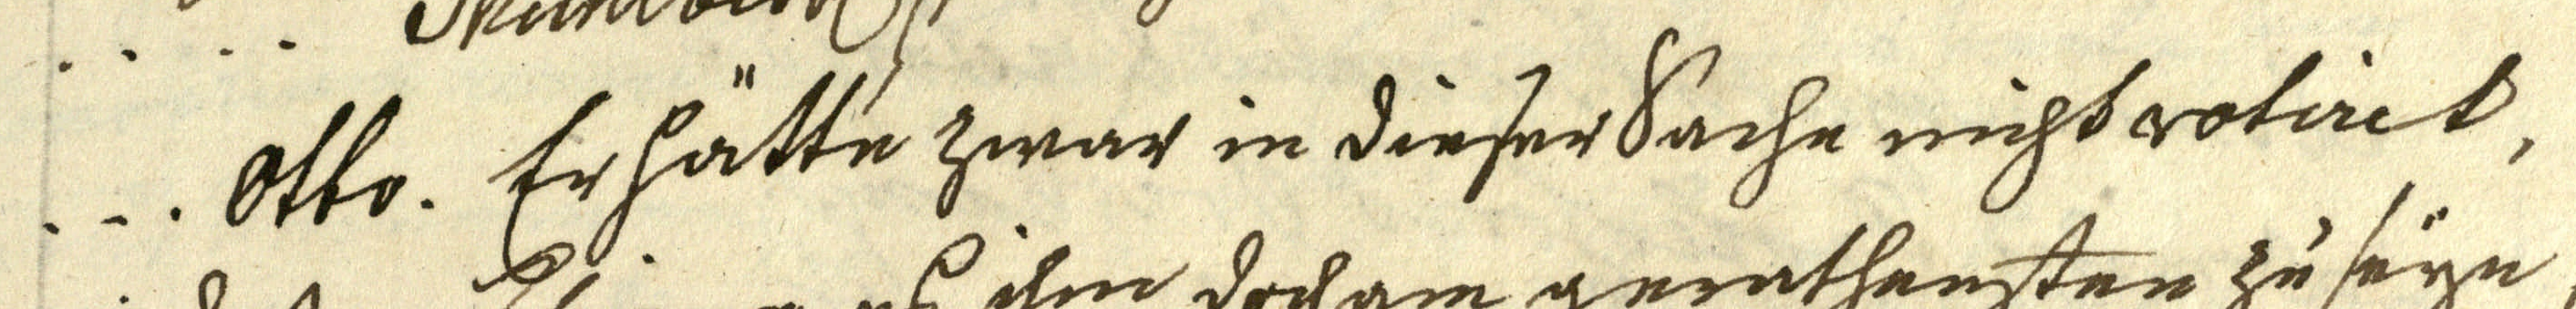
Otto. Er hätte zwar in dieser Sache nicht votiret
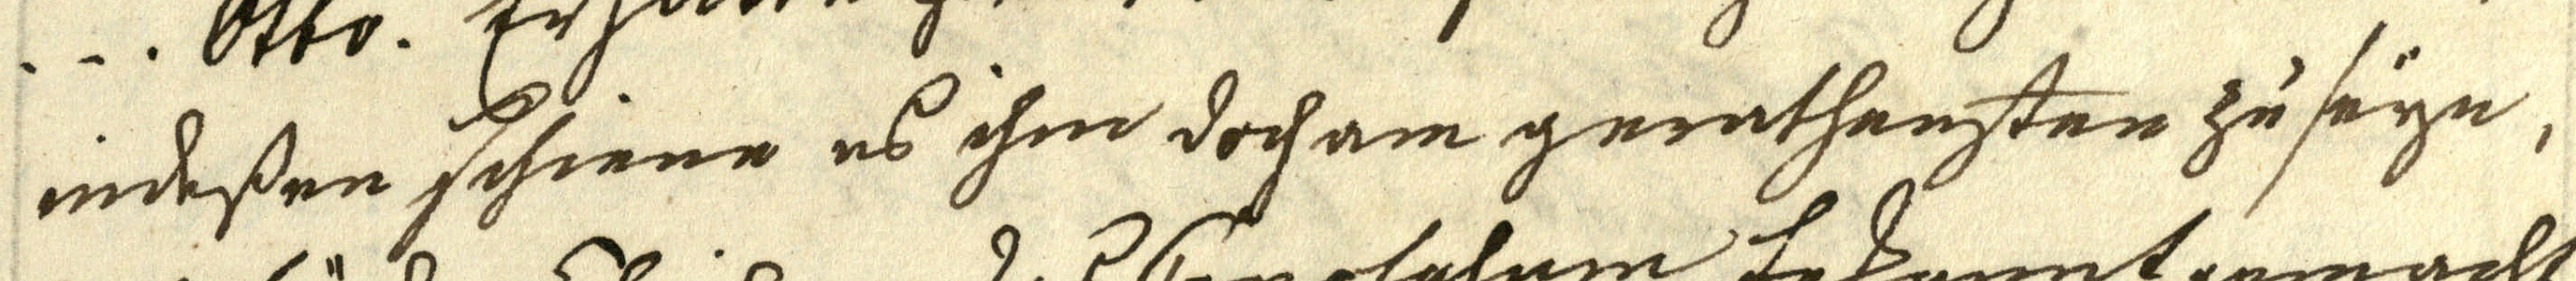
indeßen schiene es ihm doch am gerathensten zu seÿn,
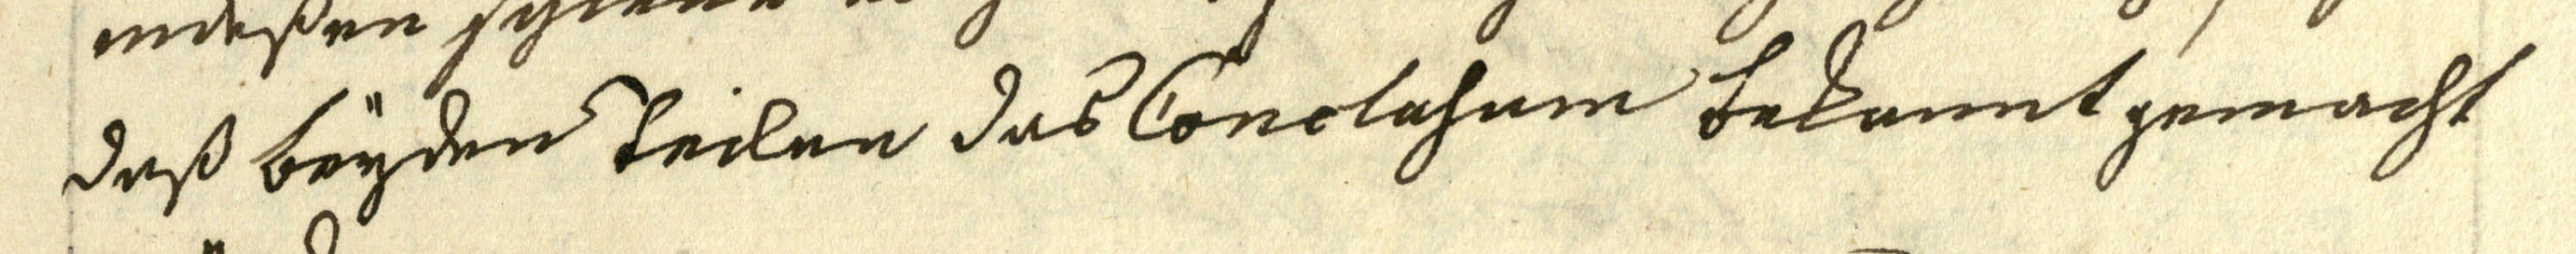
daß beiden Teilen das Conclusum bekannt gemacht
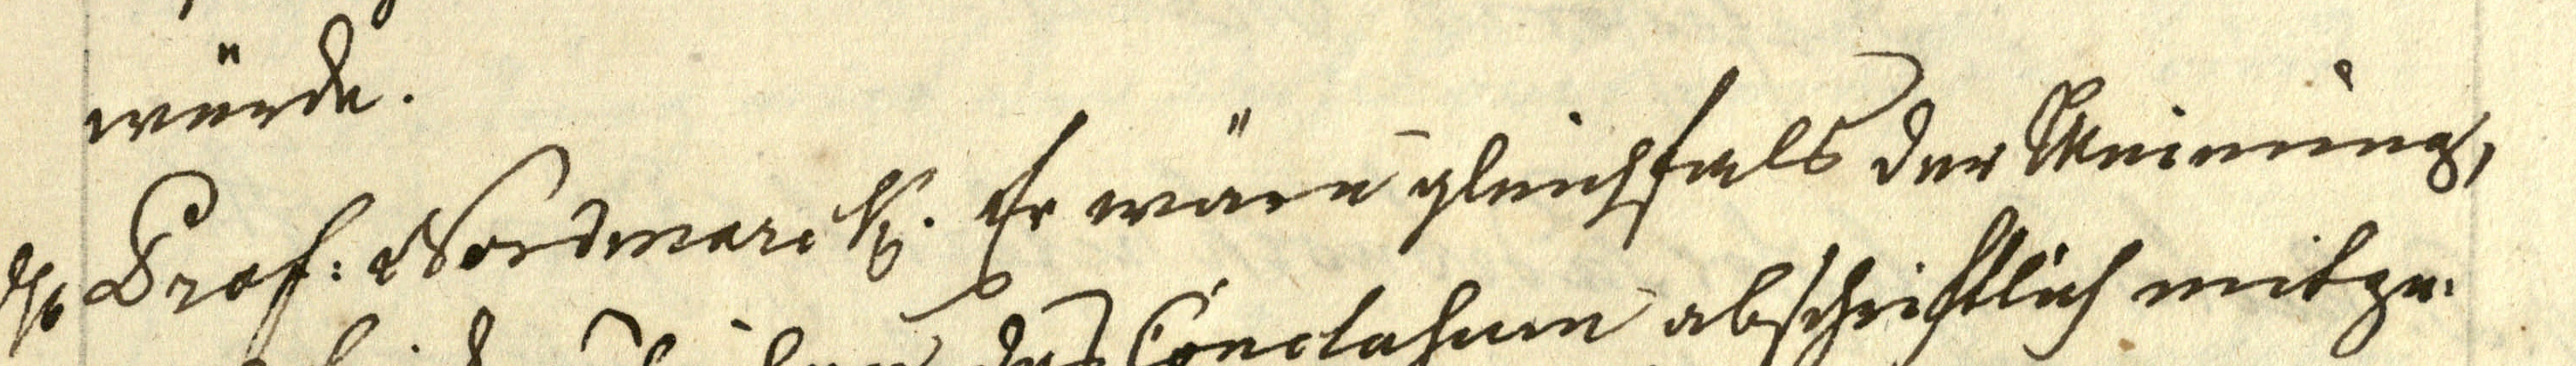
dh. Prof. Nordmarck . Er wäre gleichfals der Meinung,
